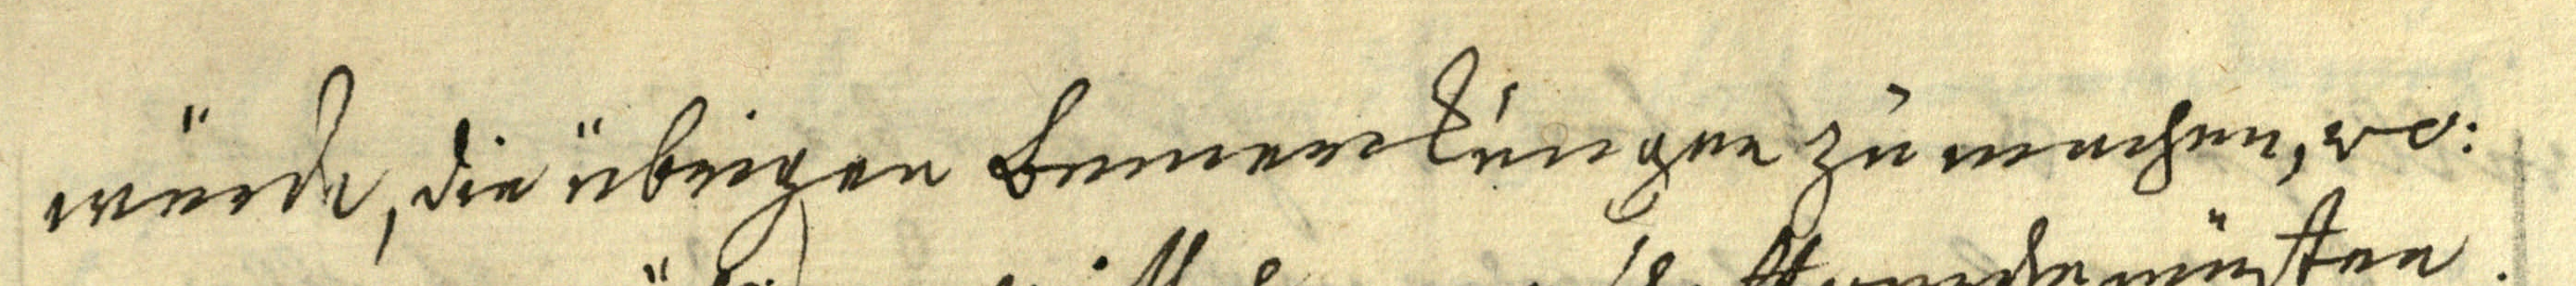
würde, die übrigen Bemerckungen zu machen, wo¬
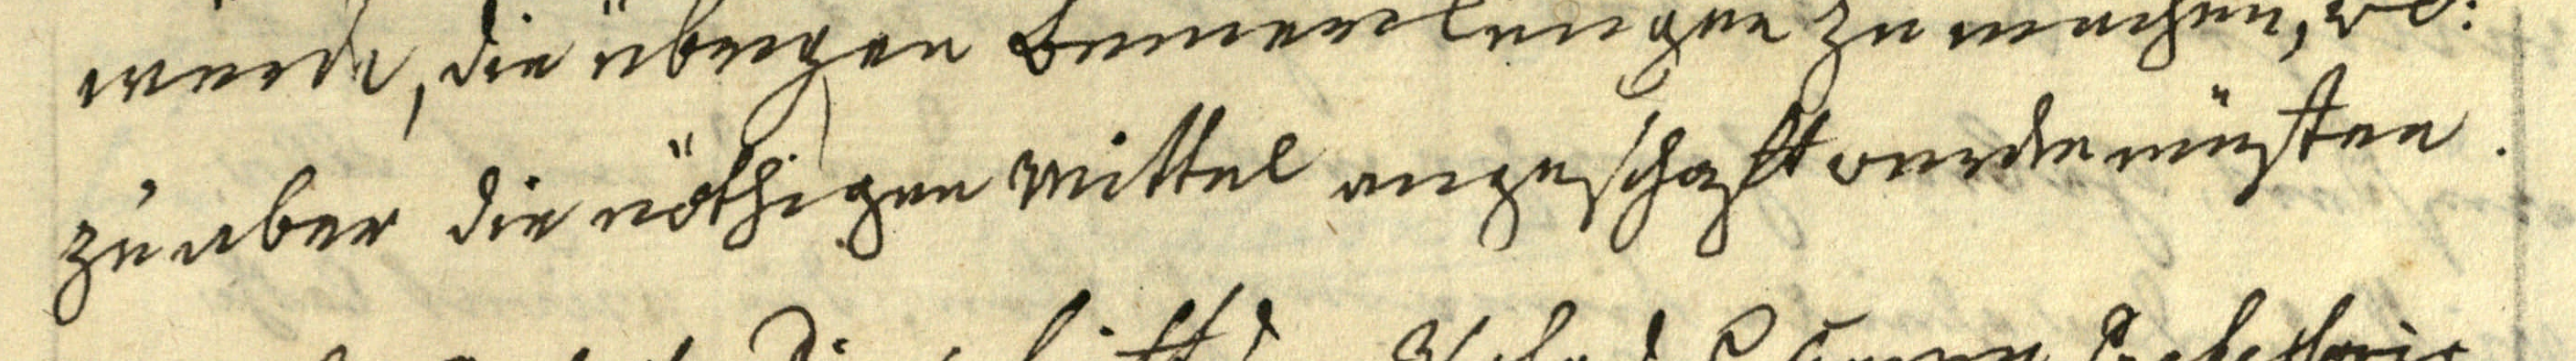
zu aber die nöthigen Mittel angeschaft werden müsten.
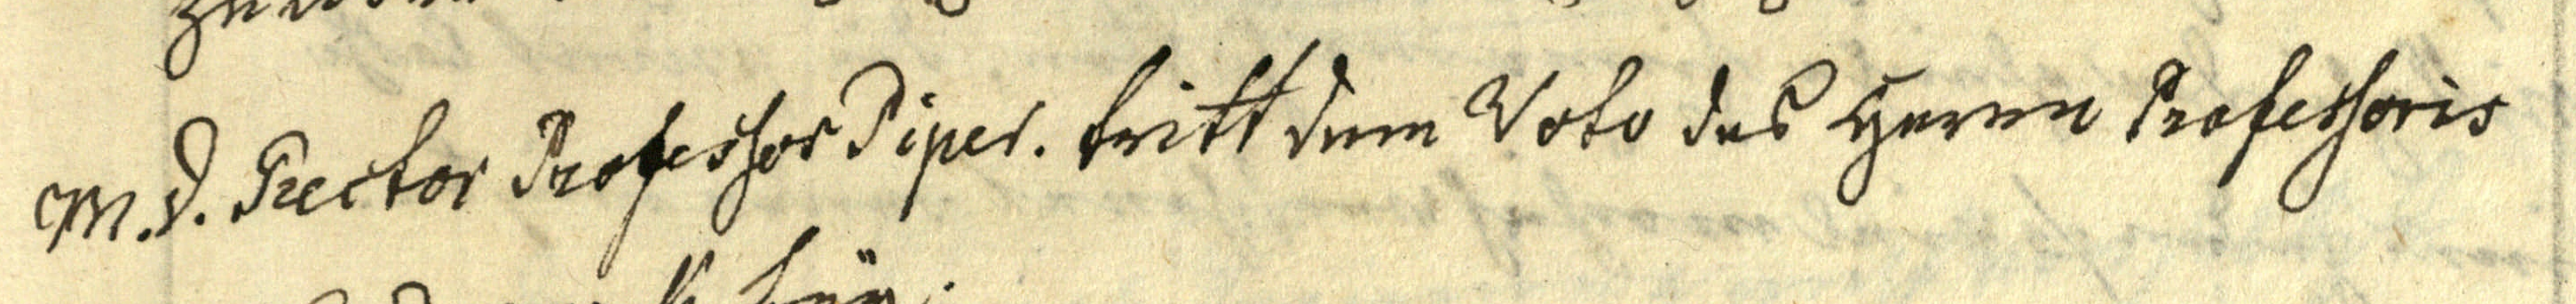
M. D. Rector Professor Piper. tritt dem Voto das Herrn Professoris
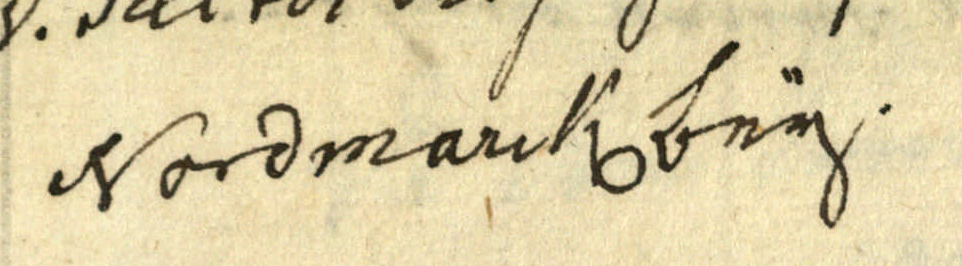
Nordmarck beÿ.
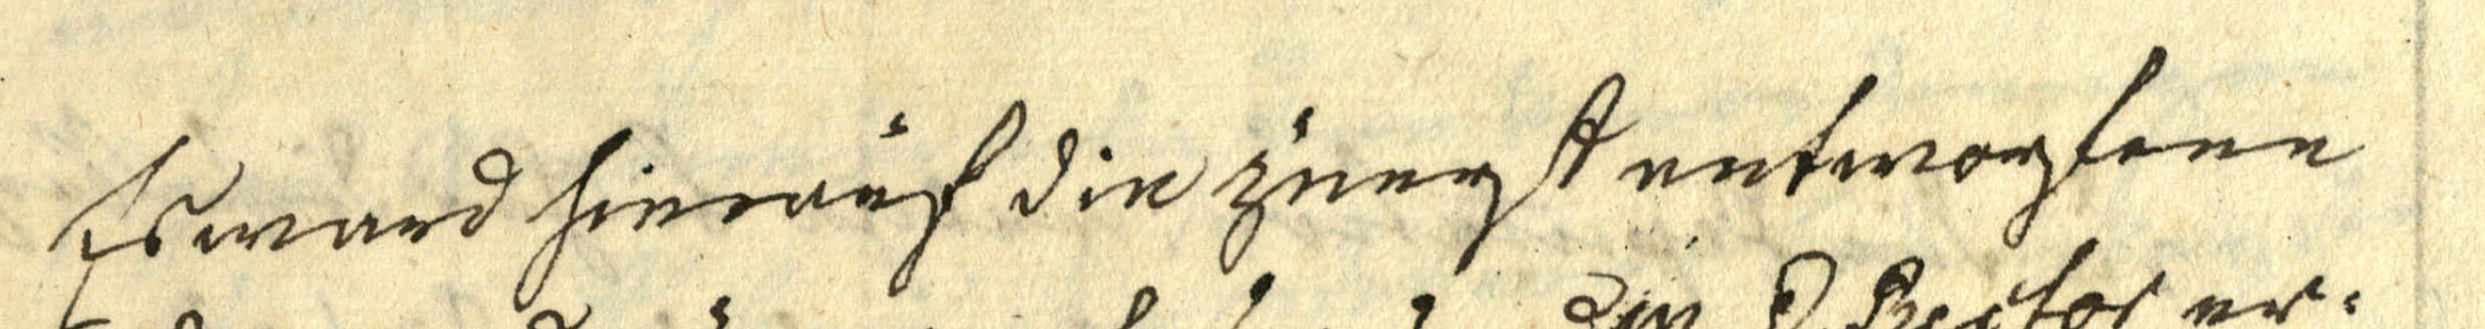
Es ward hierauf die zuerst entworfene
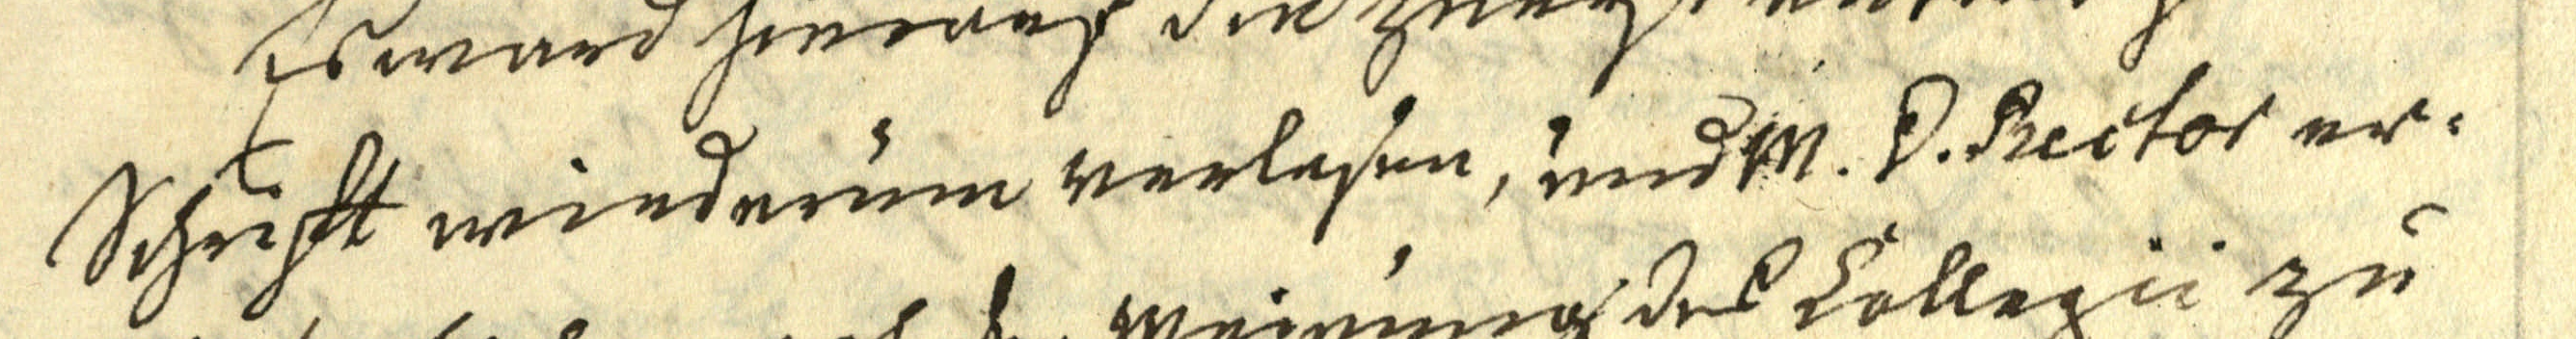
Schrift wiederum verlesen, und M. D. Rector er¬
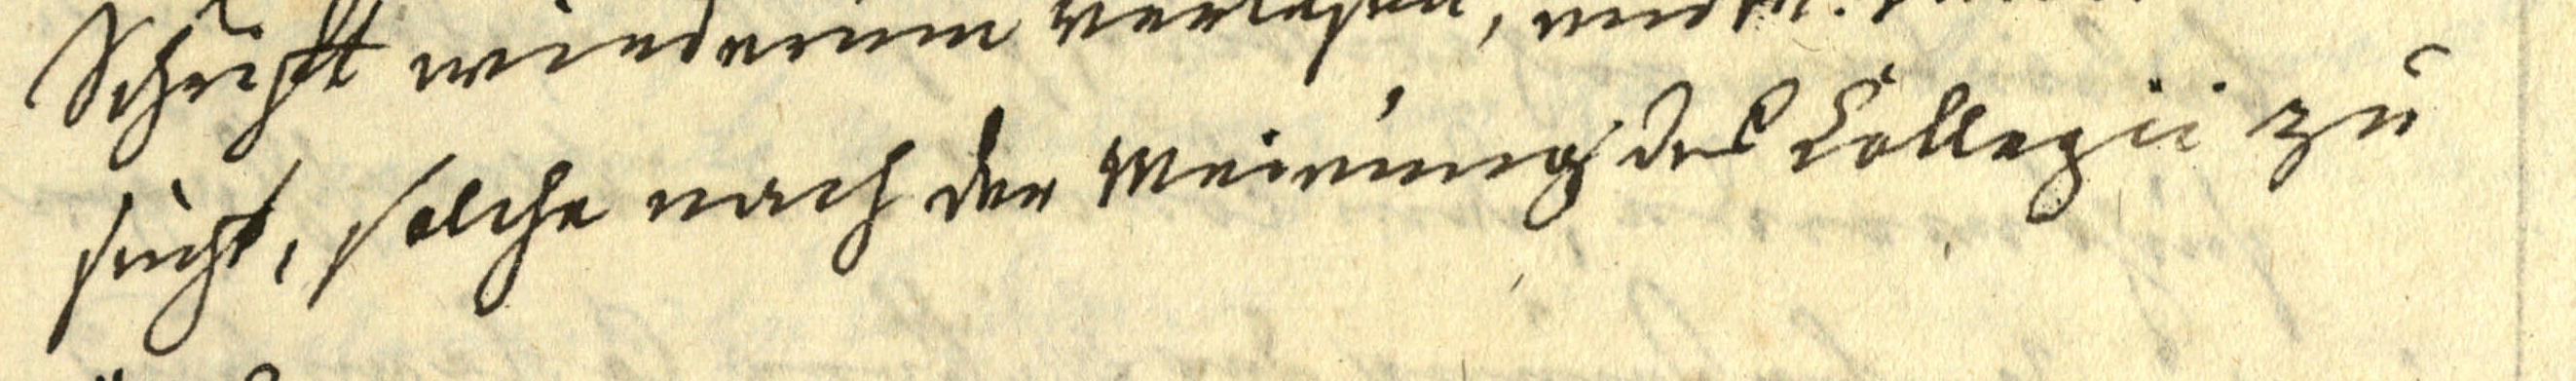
sucht, solche nach der Meinung des Collegii zu
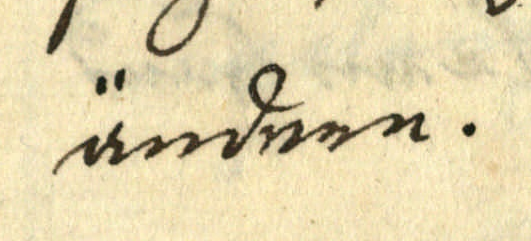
ändern.
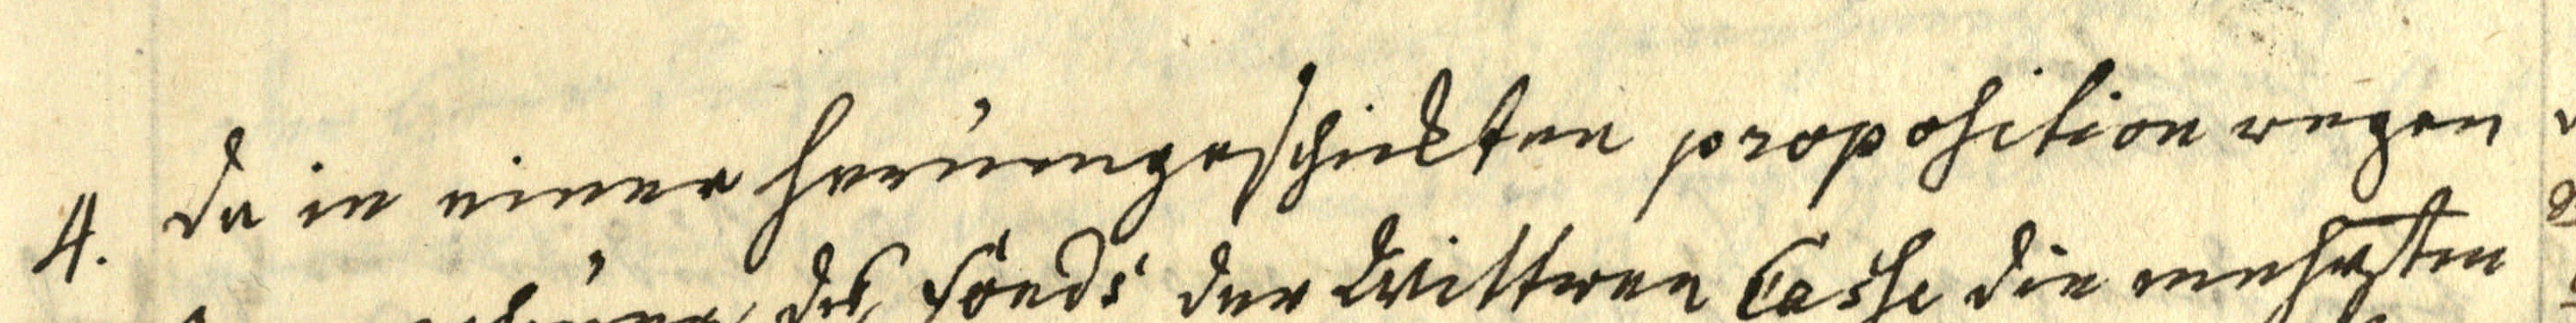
4. Da in einer herumgeschickten proposition wegen
